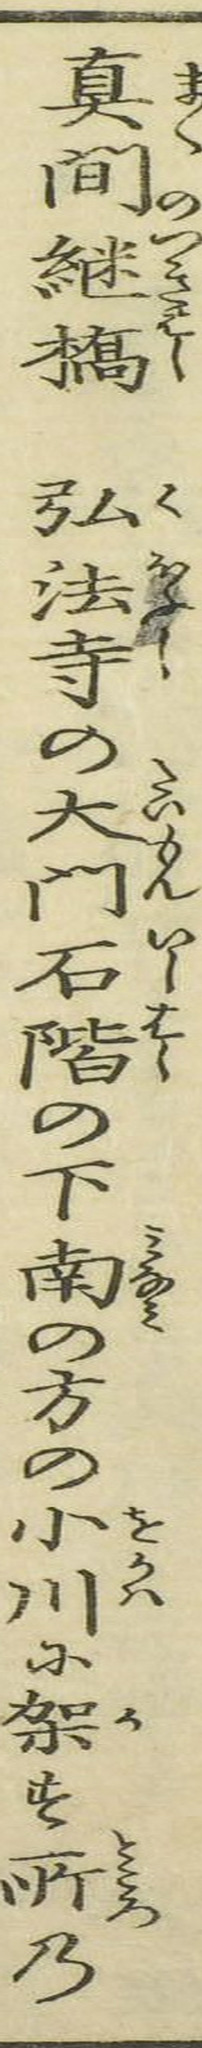真間継橋弘法寺の大門石段の下南の方の小川に架す所の
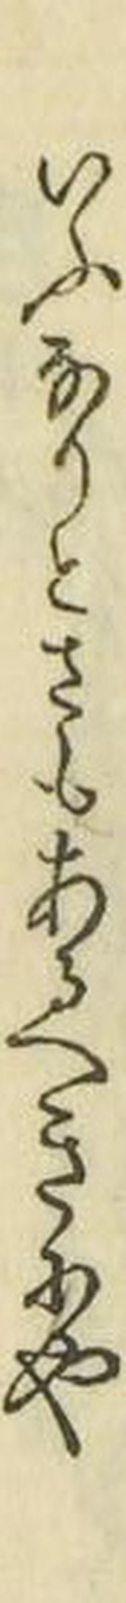いふなりとさもあるへきにや
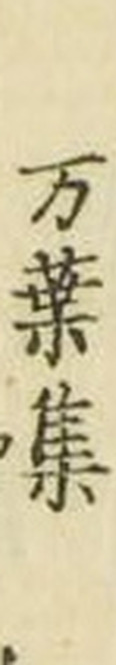万葉集
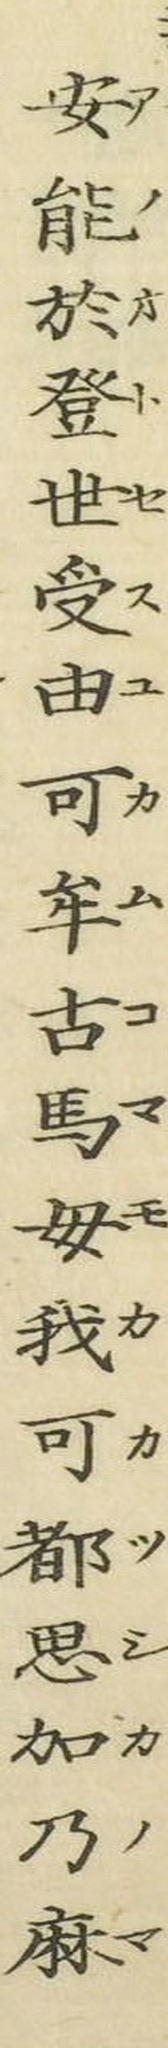安能於登世受由可牟古馬母我可都思加乃麻
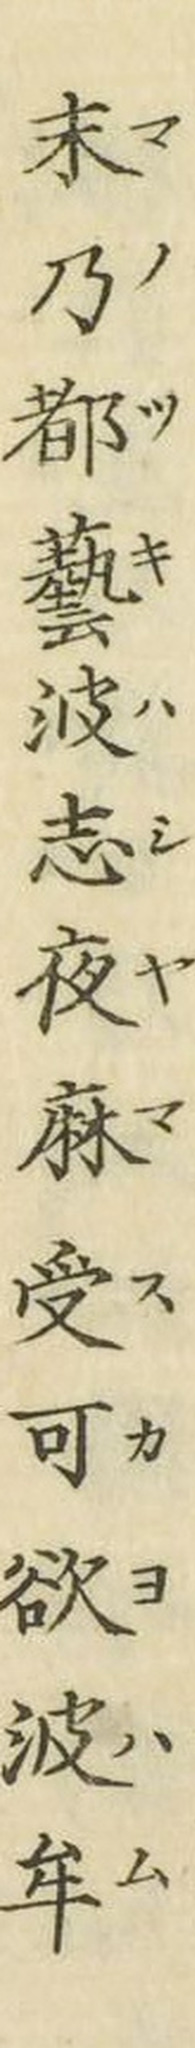末乃都芸波志夜麻受可欲波牟
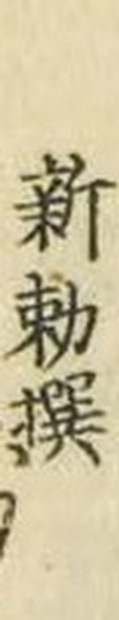新勅選
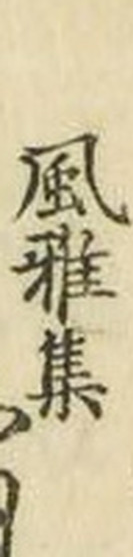風雅集
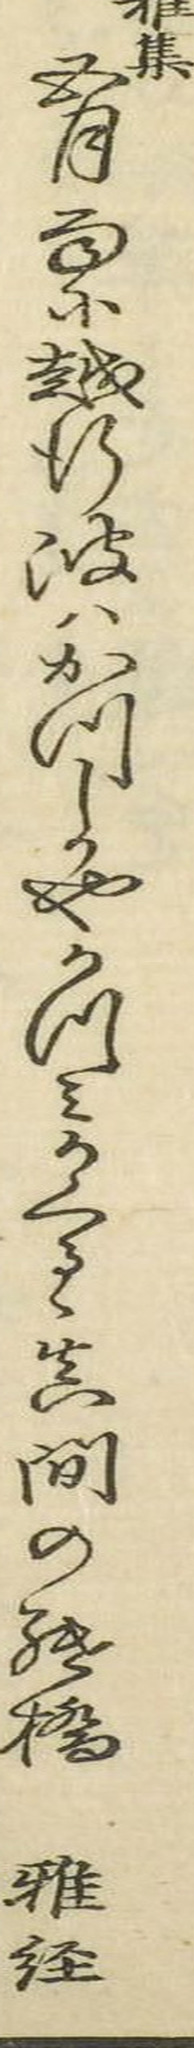五月雨に越行波はかつしかやかつみかくるゝ真間の継橋雅経
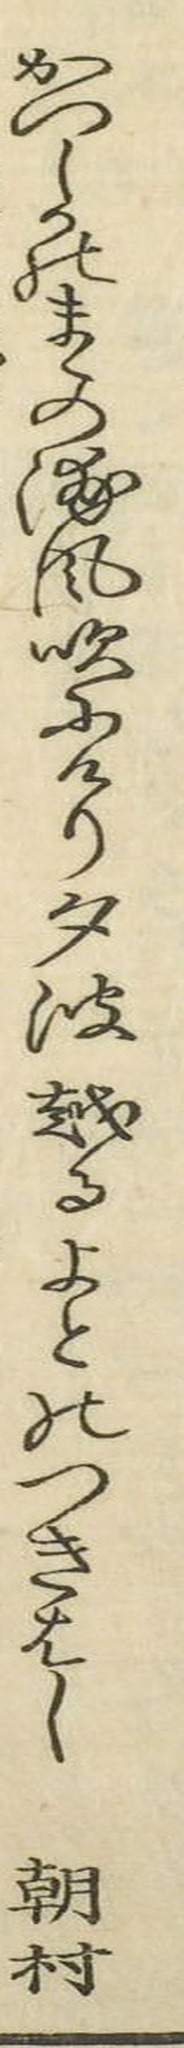かつしかのまゝの海風吹にけり夕波越るよとのつきはし朝村
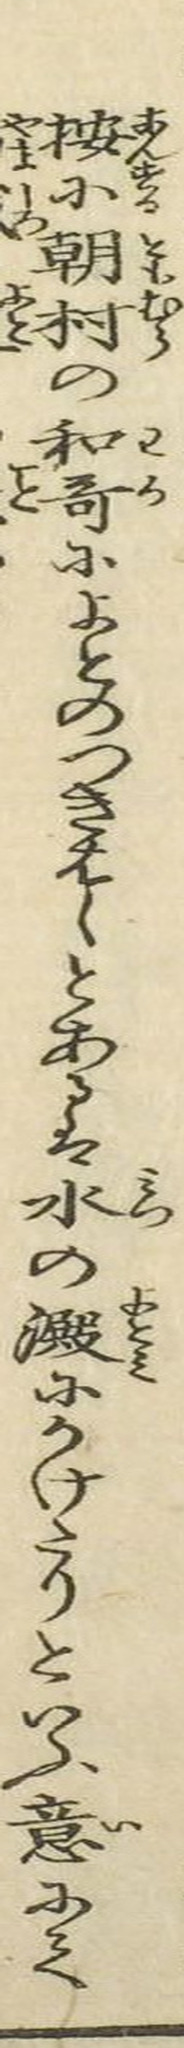按に朝村の和歌によとのつきはしとあるは水の澱にかけたりといふ意にて
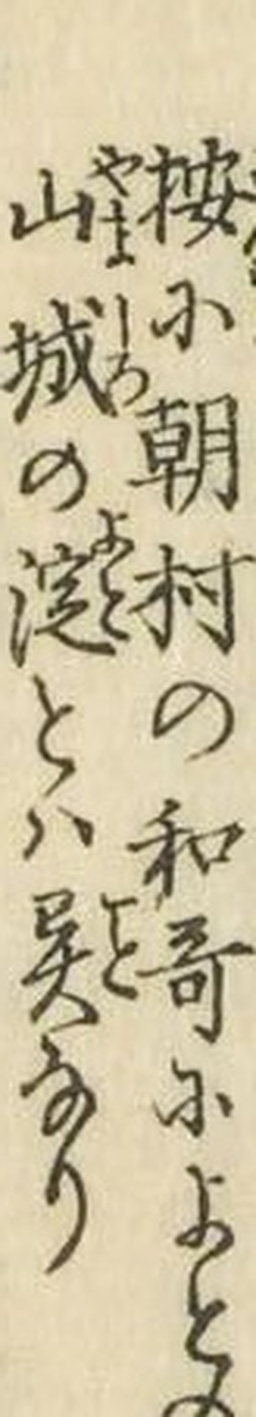山城の淀とは異なり
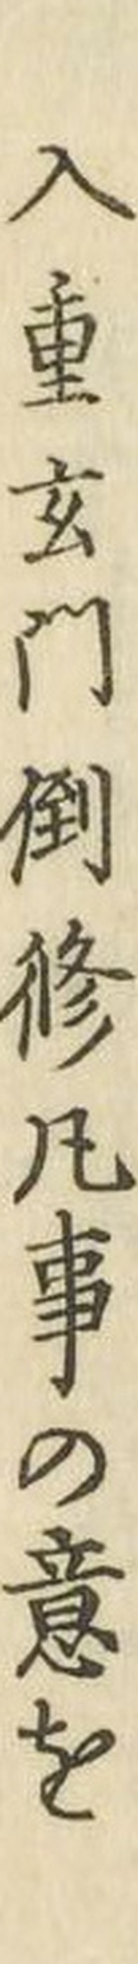入重玄門修凡事の意を
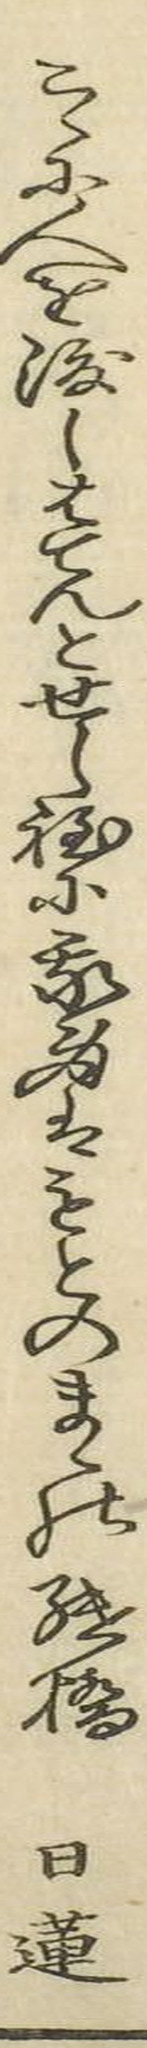こゝに人を渡しはてんとせし程に我身はもとのまゝの継橋日蓮
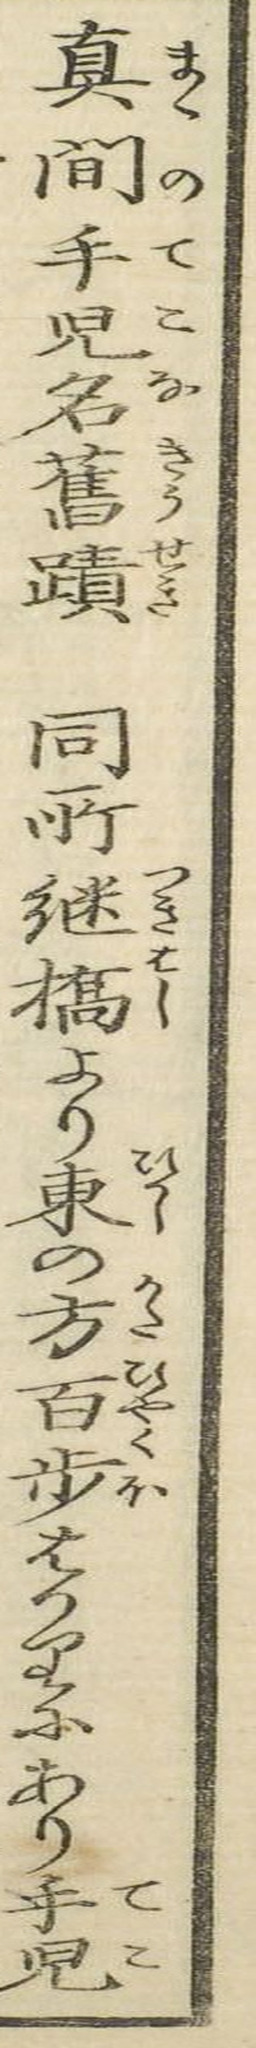真間手児名旧蹟同所継橋より東の方百歩はかりにあり手児
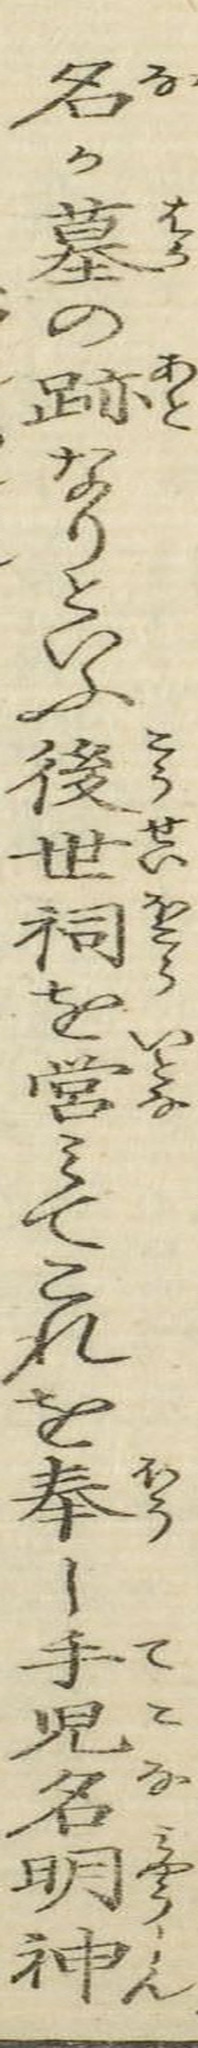名か墓の跡なりといふ後世祠を営みてこれを奉し手児名明神
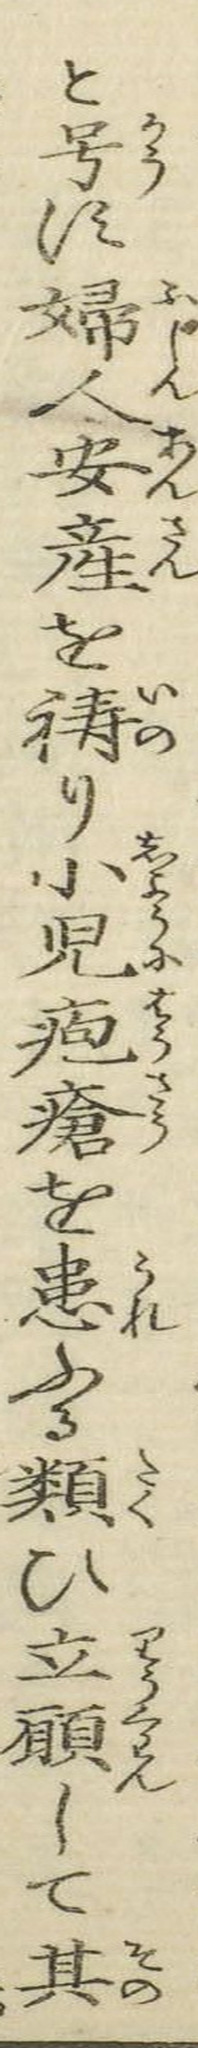と号す婦人安産を祈り小児疱瘡を患ふる類ひ立願して其
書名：江戸名所図会 20巻 巻之20
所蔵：東京学芸大学教育コンテンツアーカイブ
